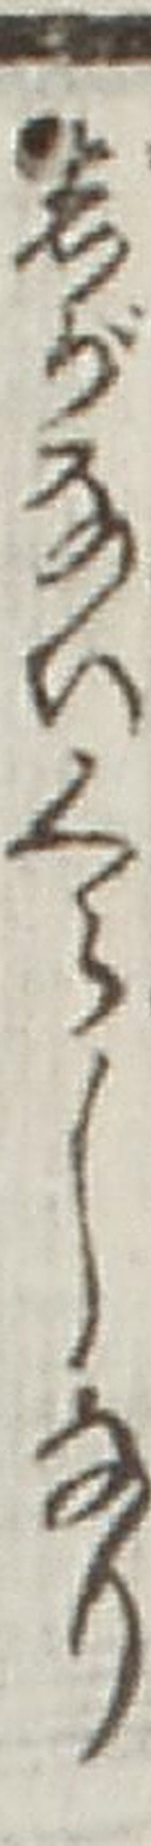しがないくらしなり
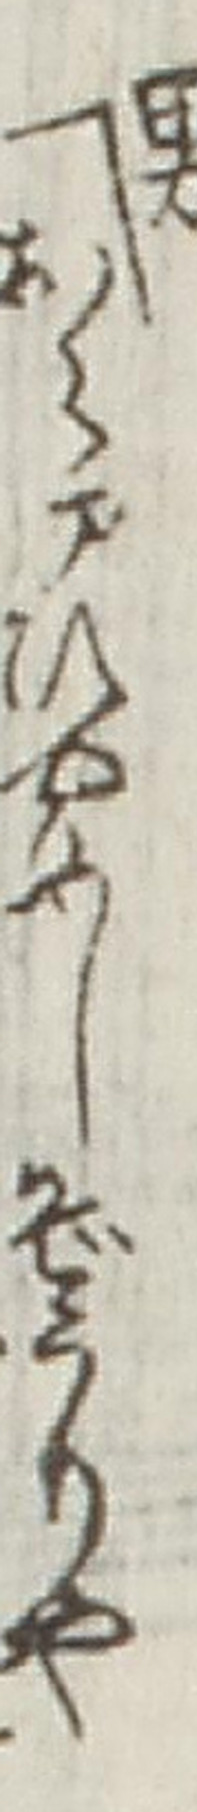〽おらァひやめしぞうりや
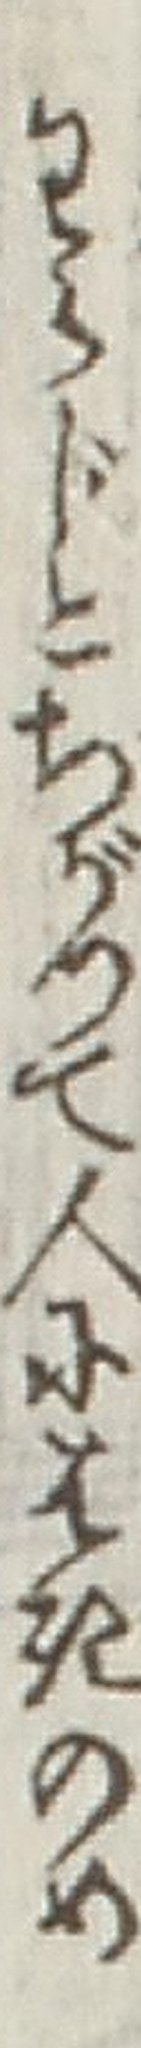わらじとちがつて人にはきのめ
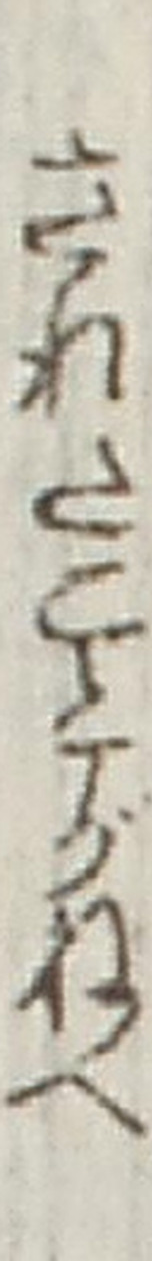されたことがねへ
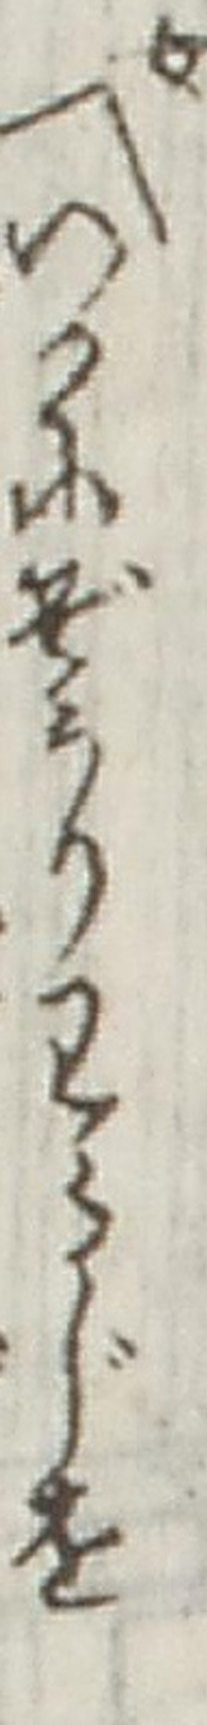〽いかにぞうりわらじを
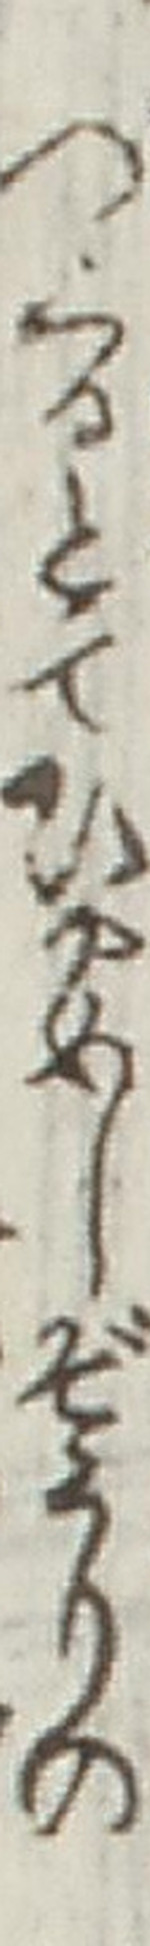つくるとてひやめしぞうりの
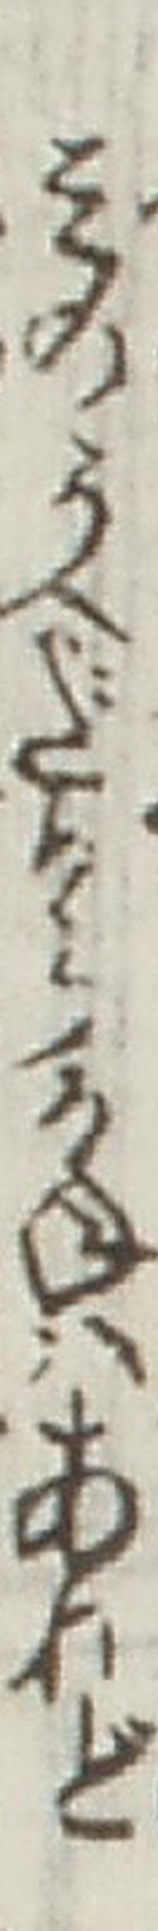みのうへだからかねはあれど
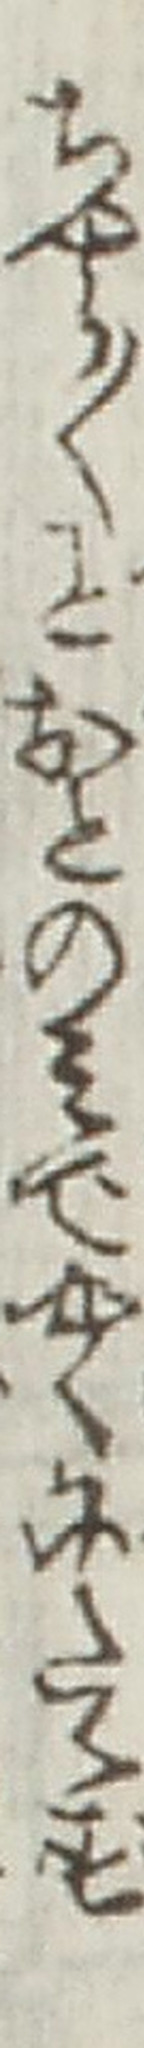ちやら〳〵とおとのみでやくにたゝず
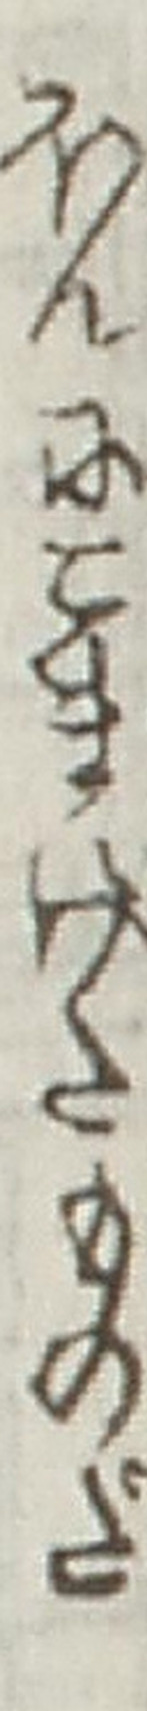ほんにこまつたものだ
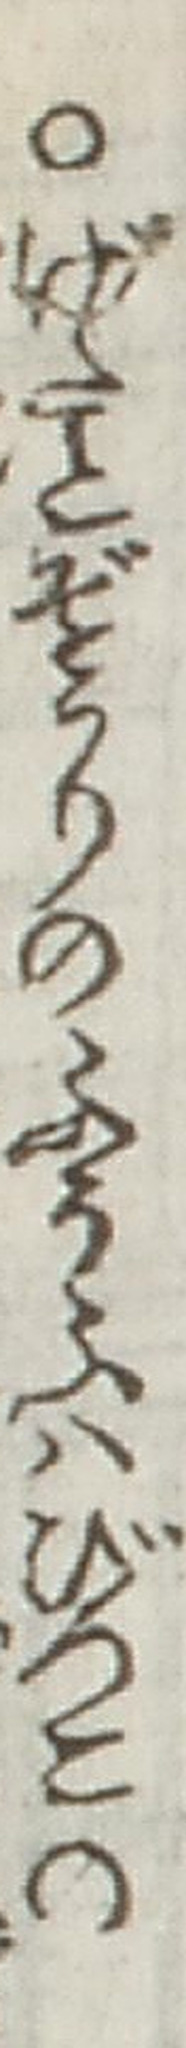○げたとぞうりのふうふはびつこの
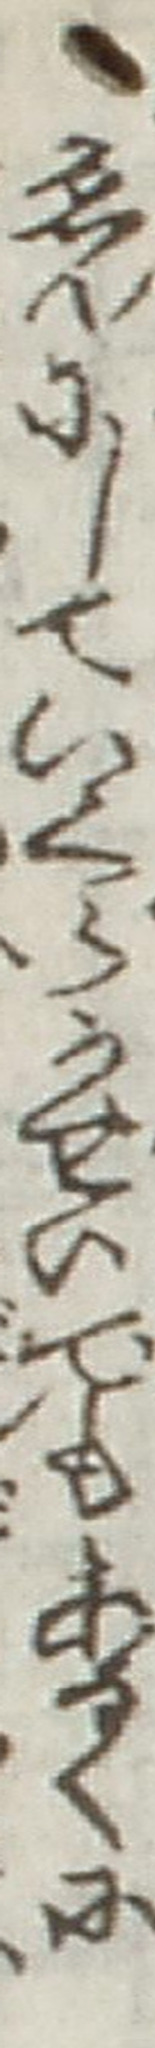ゑんにしていくらかせいでもあるくに
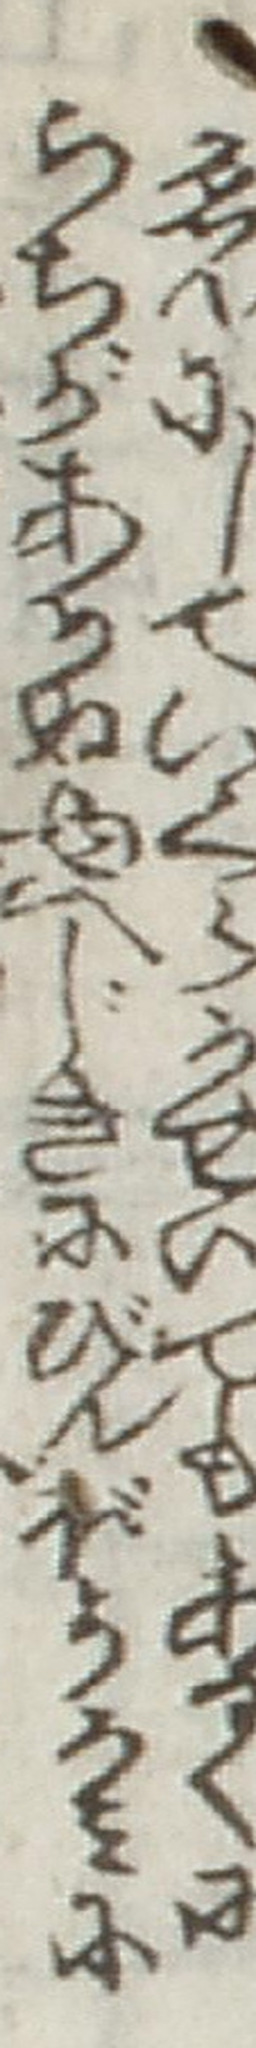らちがあかぬゆへじきにびんぼうかみに
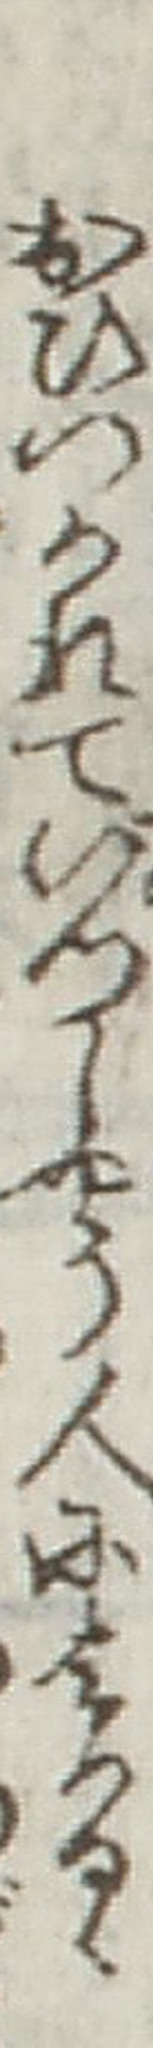おひつかれていつしやう人にはかるゝ
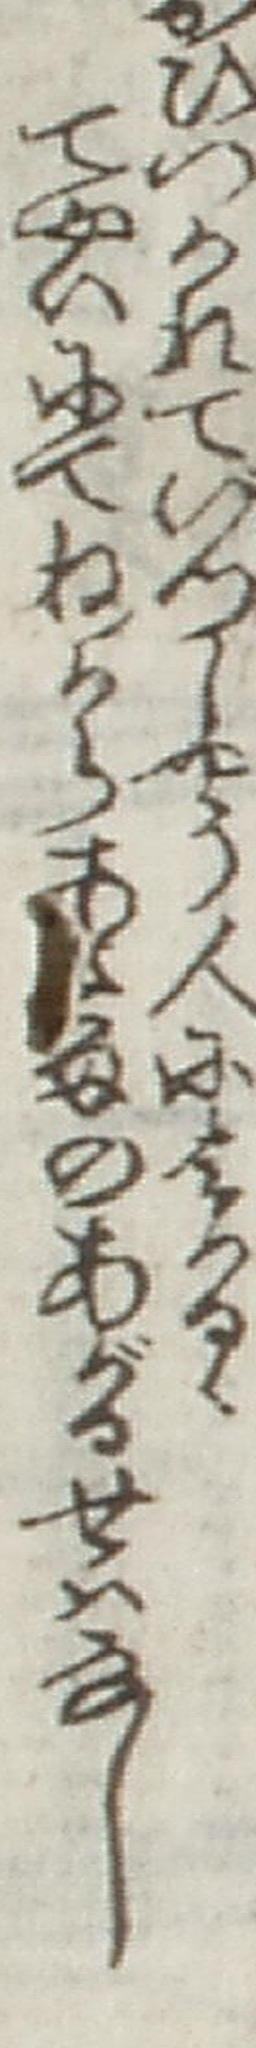てやいにてねからあたまのあがるせはなし

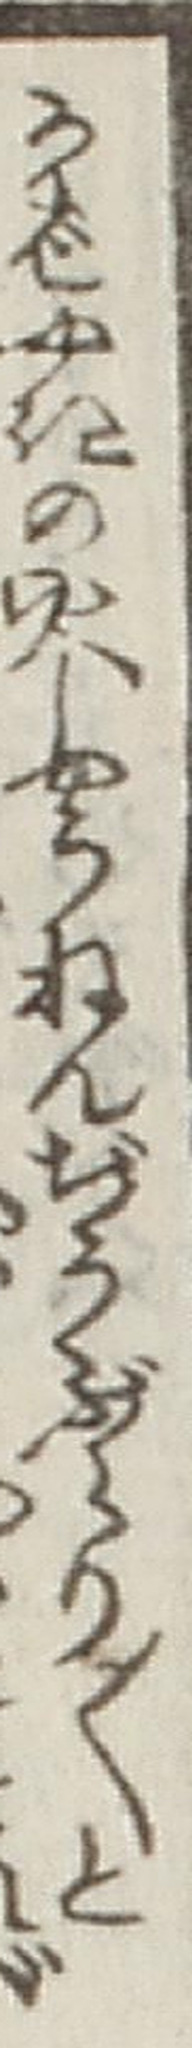かばやきの火しやうねんぢうぶらり〳〵と
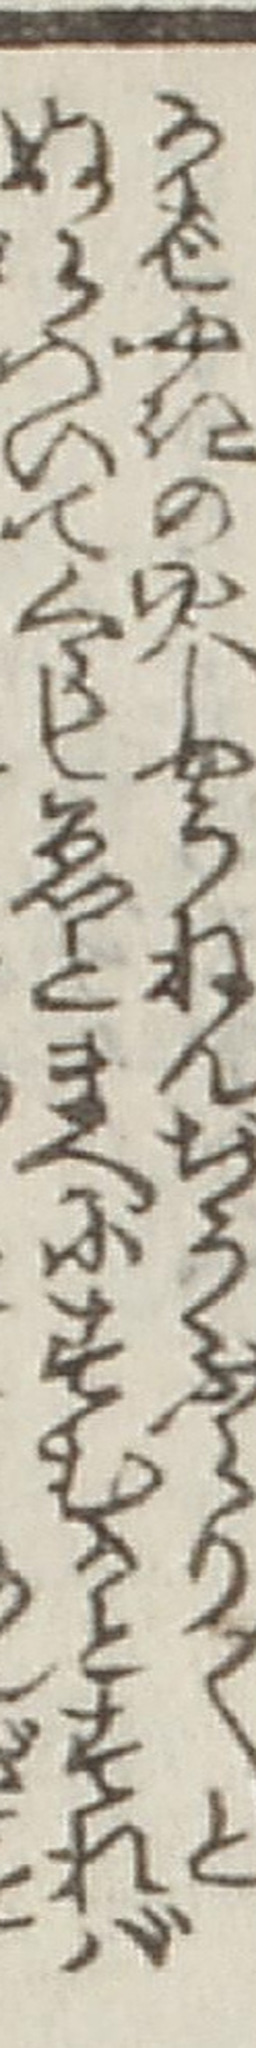ぬら？づいてくらしゑとまへにすむかとすれば
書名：三世相出雲當座帳　上下冊
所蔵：東京大学地震研究所図書室 Earthquake Research Institute Library, The University of Tokyo, JAPAN
